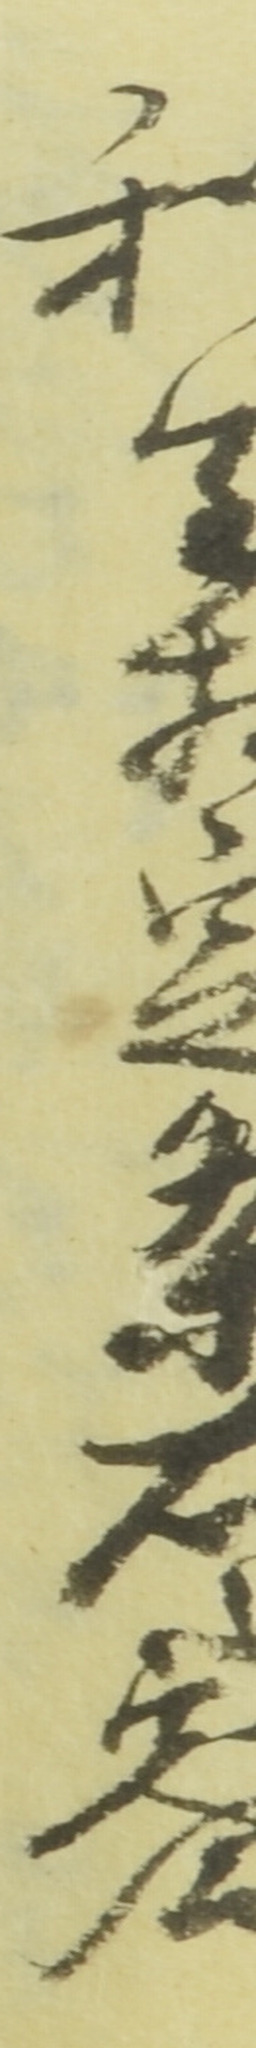利生相定条右之割合
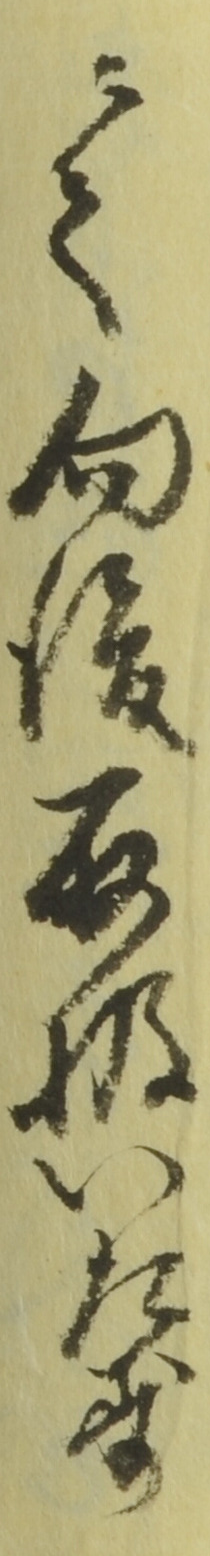ニて向後取扱いたす
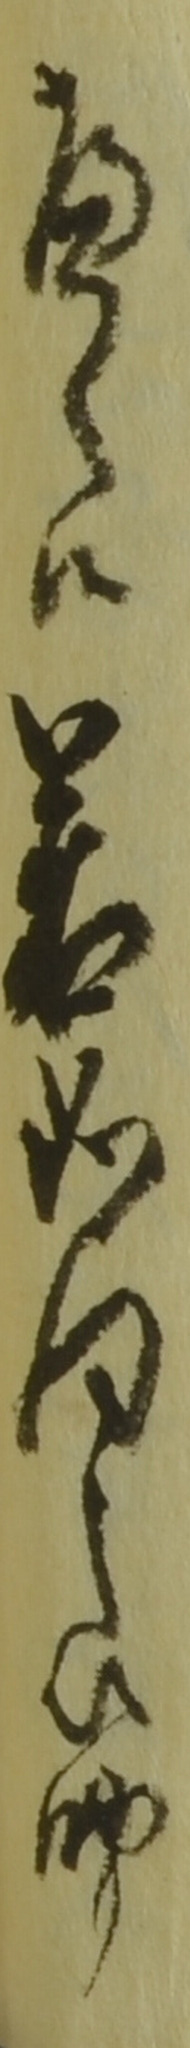へく候若如何之筋
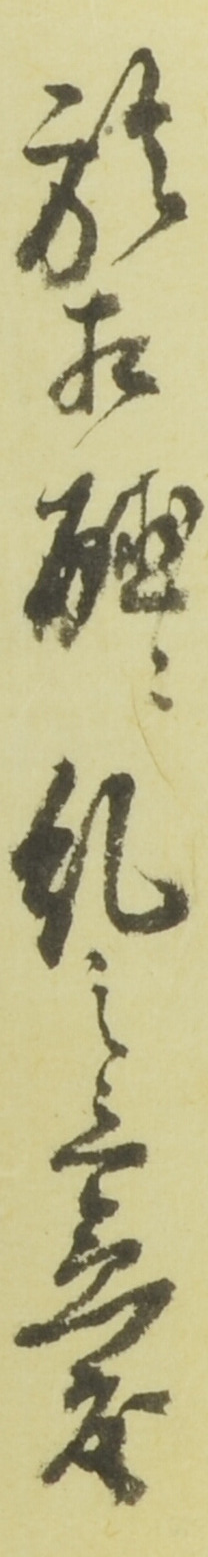御相聴ニ糺之上急度
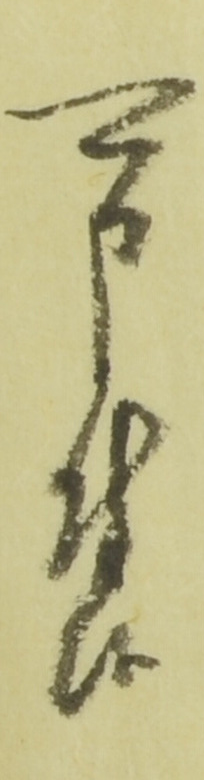可申付候
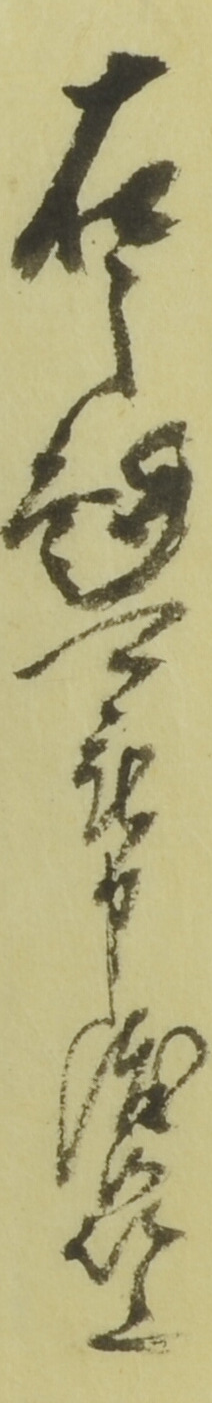右之趣可被申渡候以上
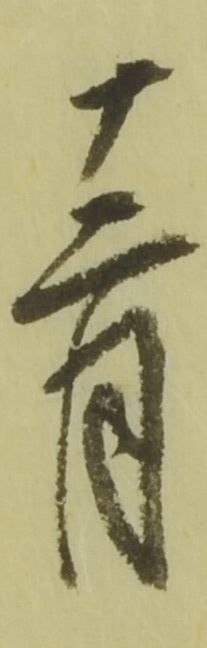十二月
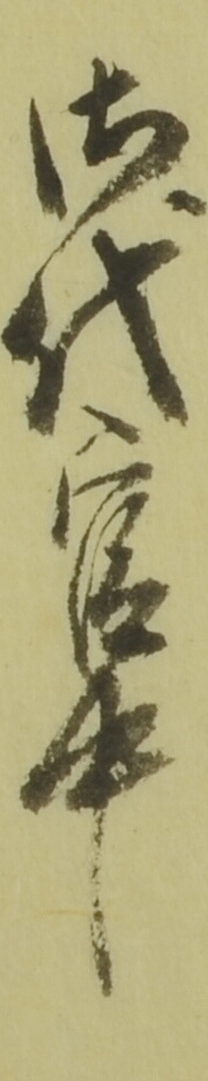御代官中
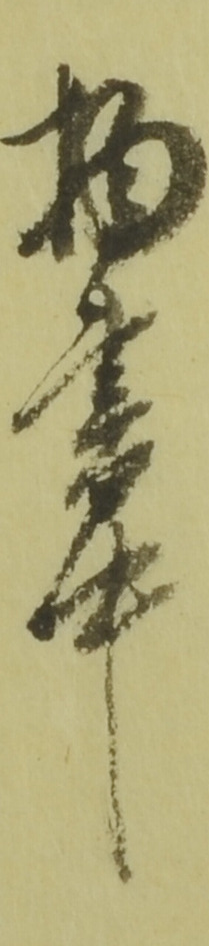物書中
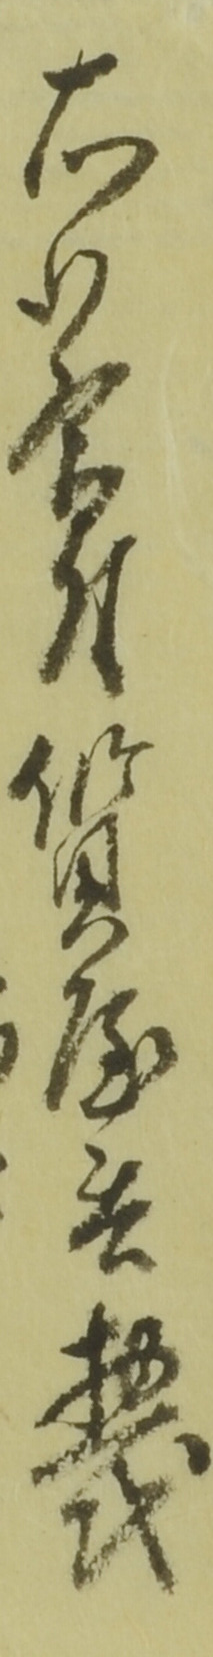右御書付質屋共惣代
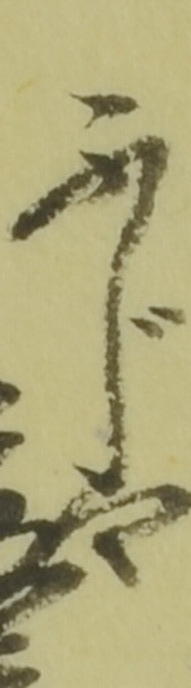ふじ屋
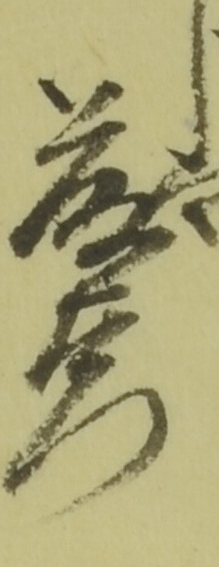藤右衛門
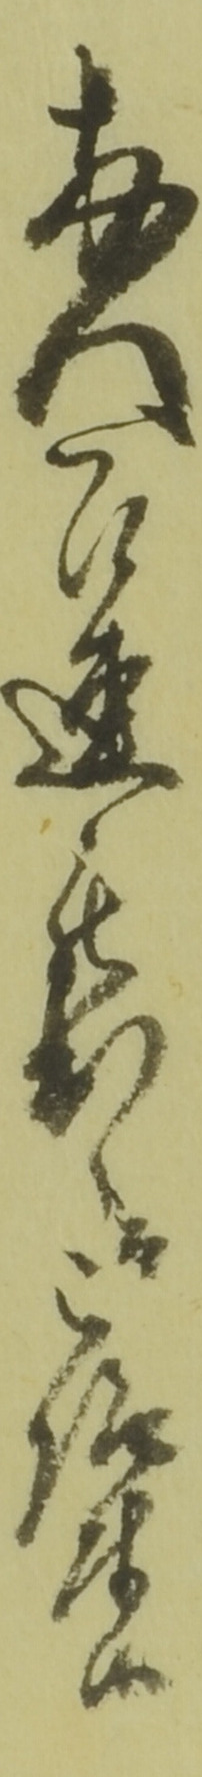両人召連罷出候而被仰付候
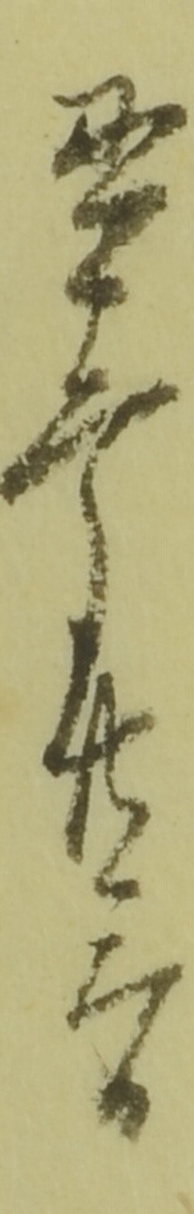丑十二月廿三日

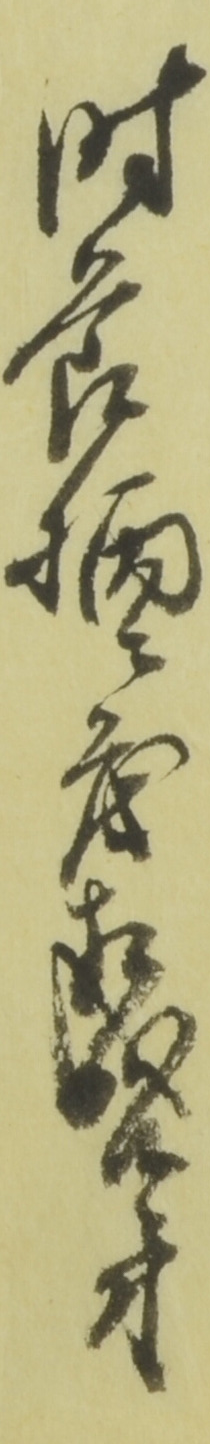時節柄ニも相成候ニ付
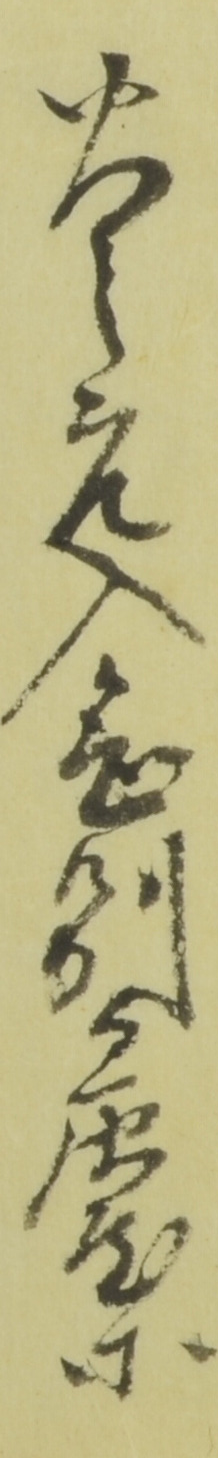火之元入念別而灰屋等
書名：御触書御書附控
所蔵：伊那市立高遠町図書館・合同会社AMANE
